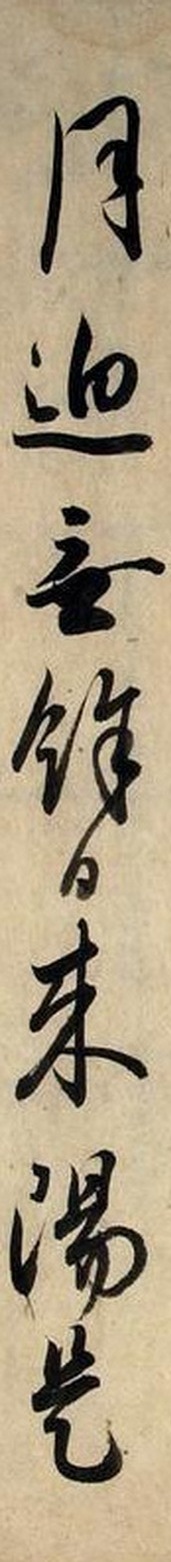月迫無余日来陽是
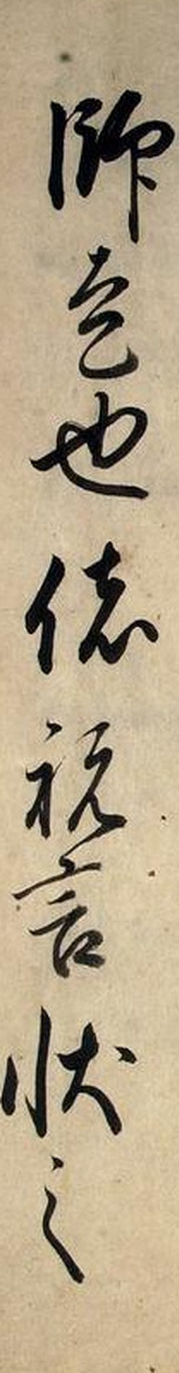師走也偖祝言状之

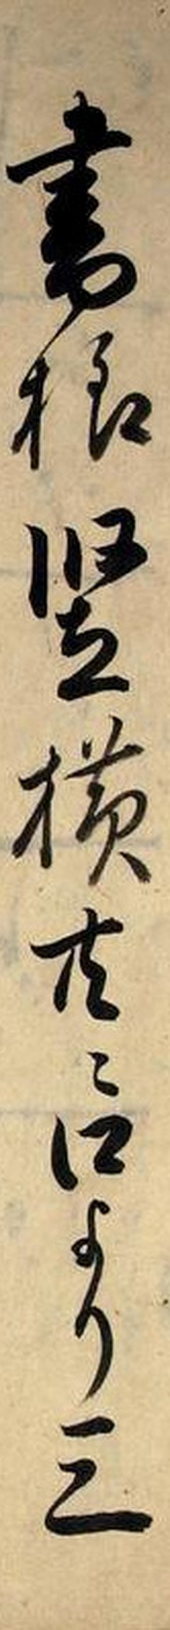書様竪横共に口より三
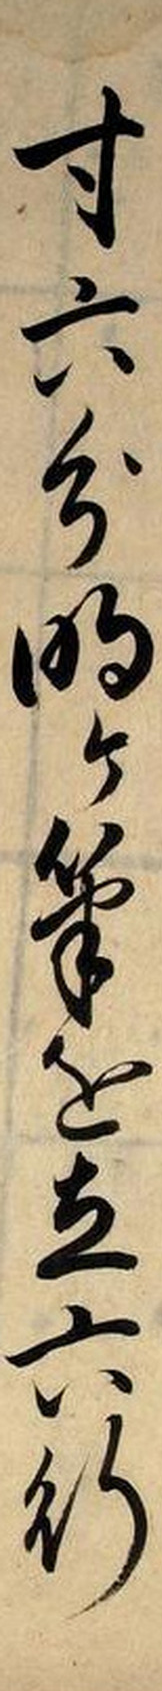寸六分明ケ筆を立六行
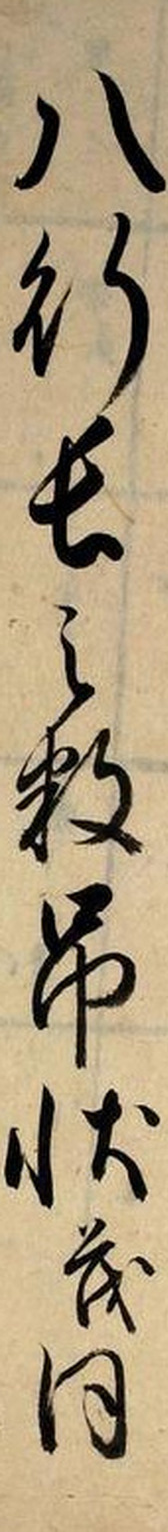八行長之数吊状茂同
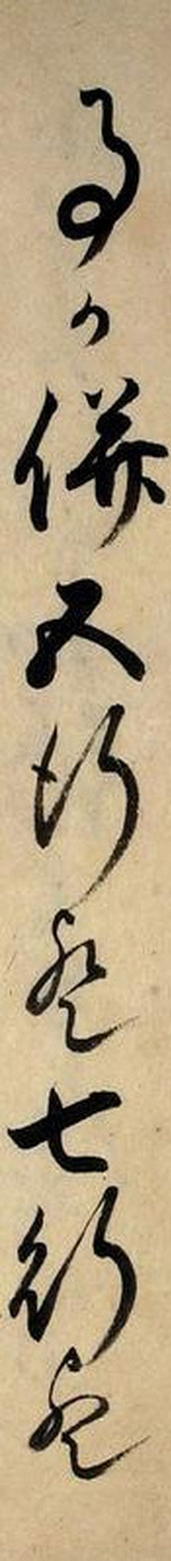事か併五行か七行か
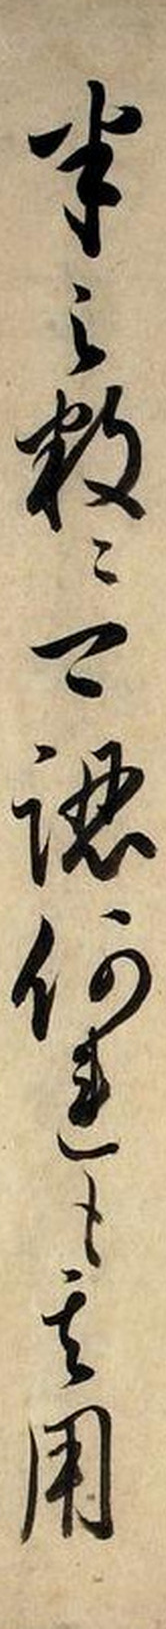半之数ニ可認何れも其用
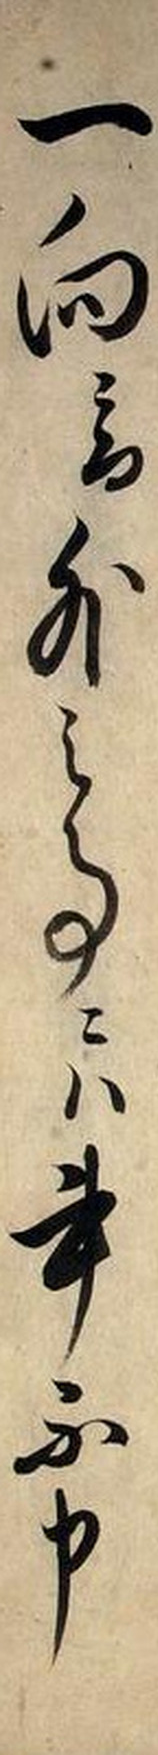一向ニ而外之事ニハ書不申

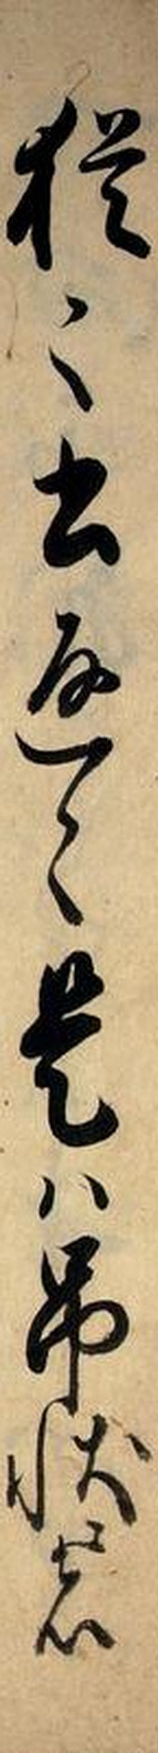猶々書返々是は吊状ニは
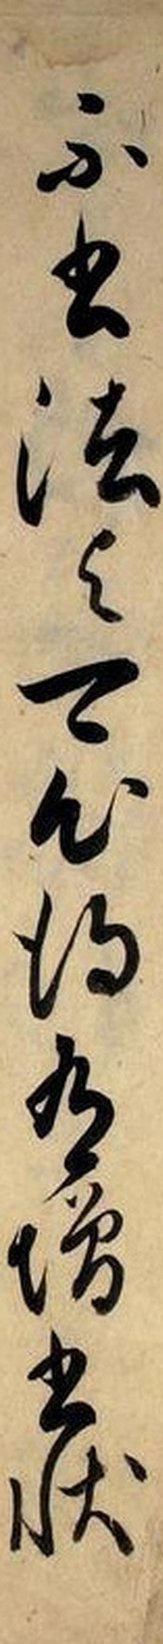不書法と可心得有増書状
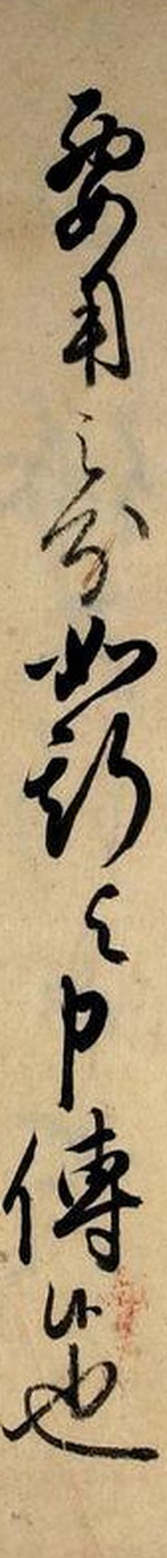要用之分如斯と申伝候也
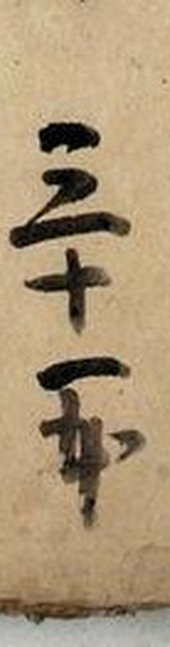三十一本
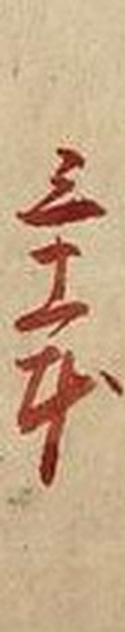三十一本

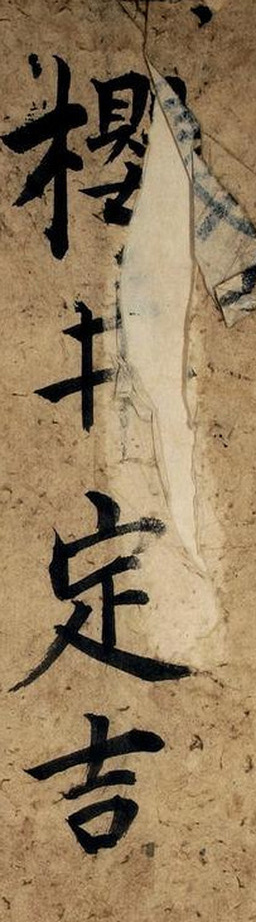桜井定吉
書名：消息千字文（往来物、手習手本）
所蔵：福井県文書館 Fukui Prefectural Archives
